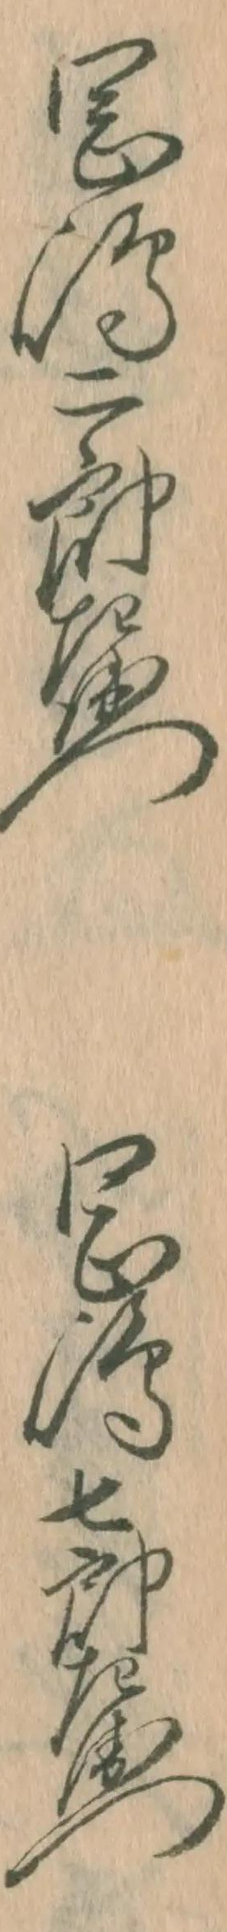岡島二郎左衛門岡島七郎左衛門
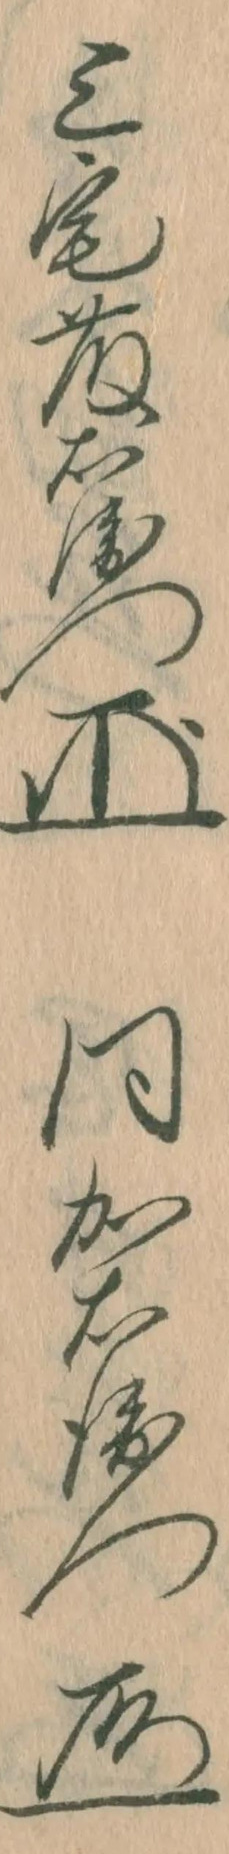三宅藤右衛門同加右衛門
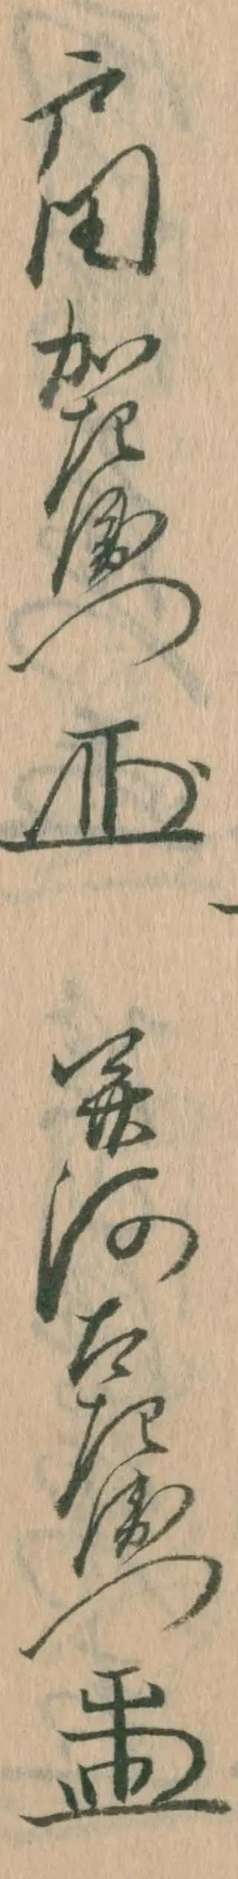戸田加左衛門並河太左衛門
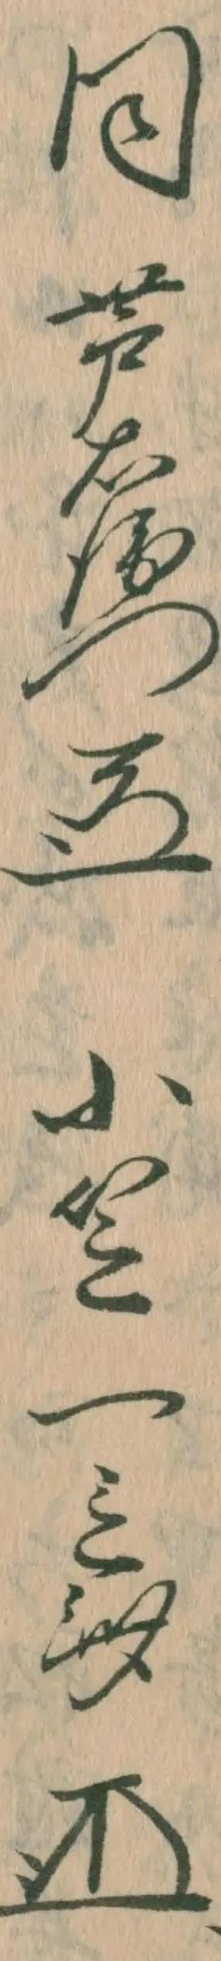同芦右衛門小笠一三斎
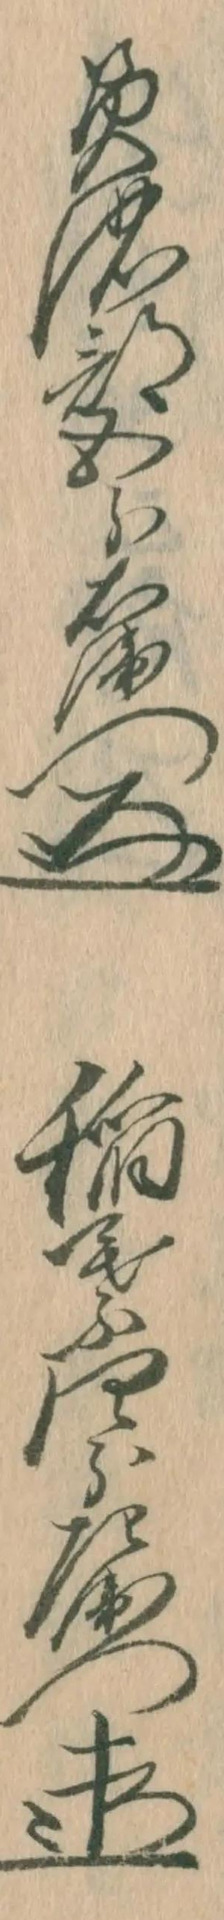美濃部五郎右衛門稲葉四郎左衛門
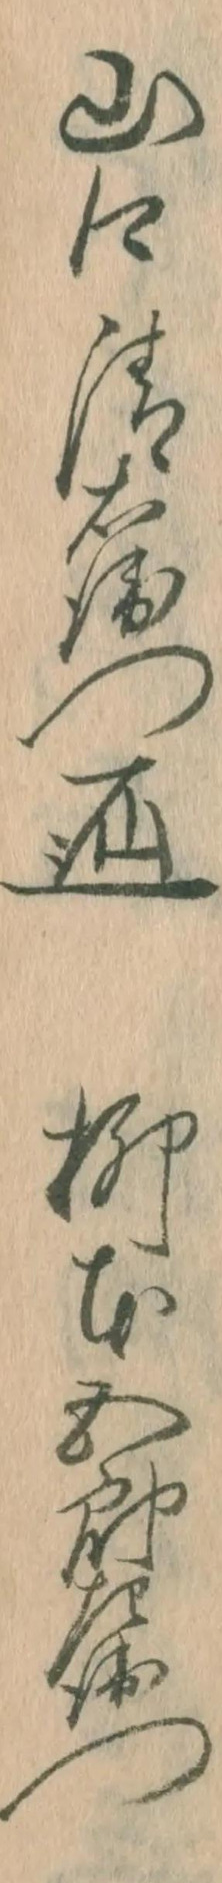山口清右衛門柳本五郎左衛門

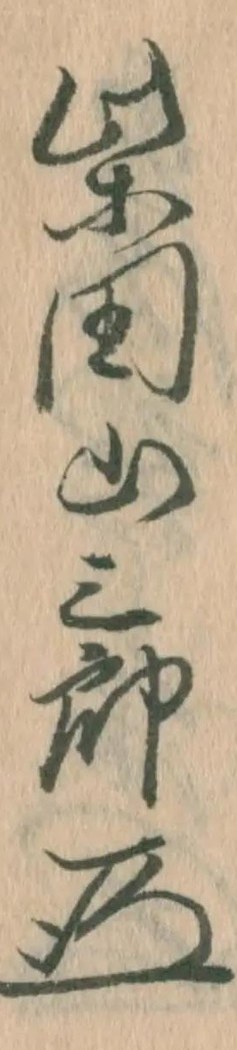柴田山三郎
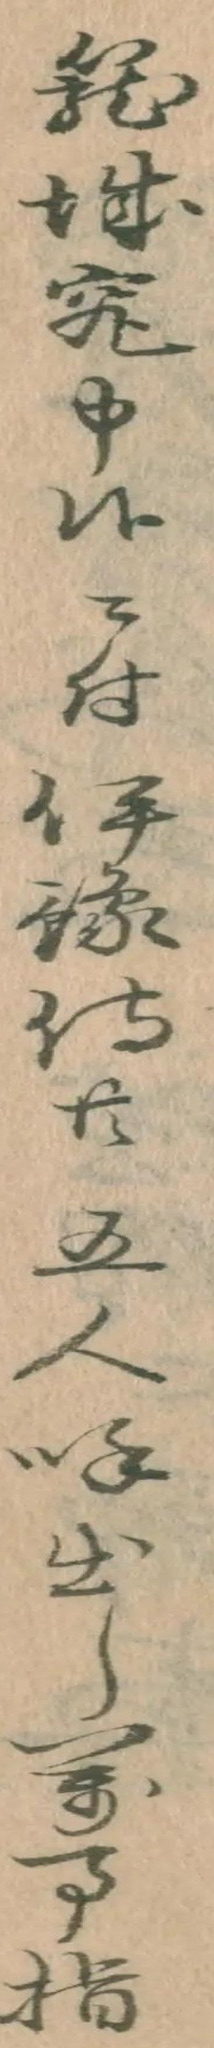籠城究申候に付伊予侍共五人呼出し万事指
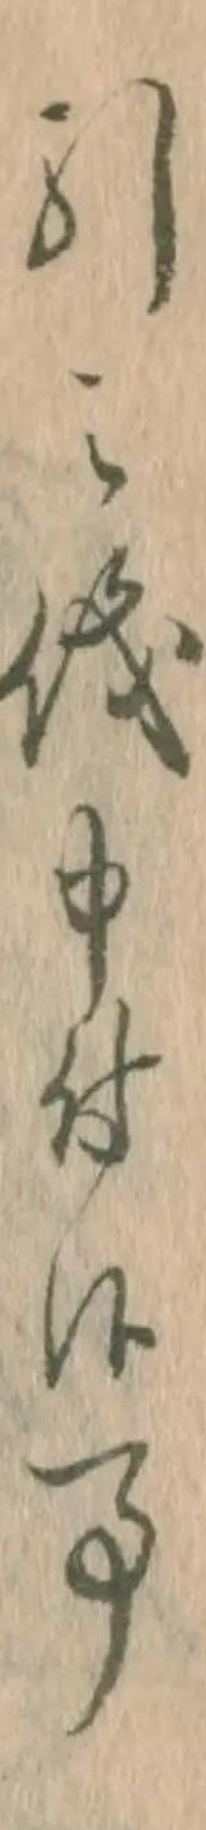引之儀申付候事
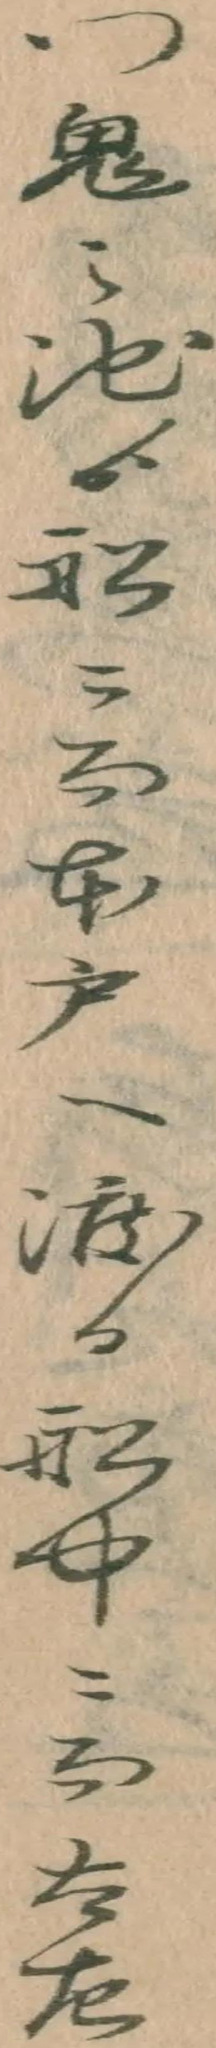門鬼之池ゟ舩に而本戸へ渡る舩中に而太左
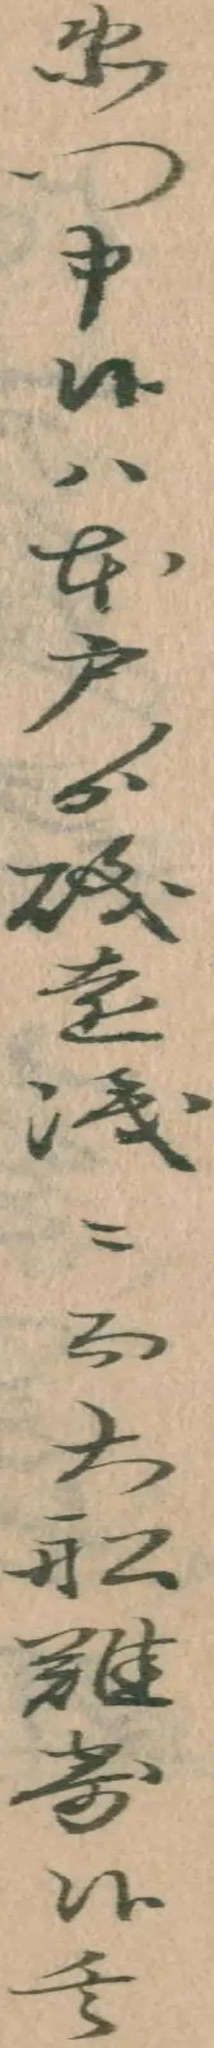衛門申候は本戸ゟ磯遠浅に而大舩難寄候其
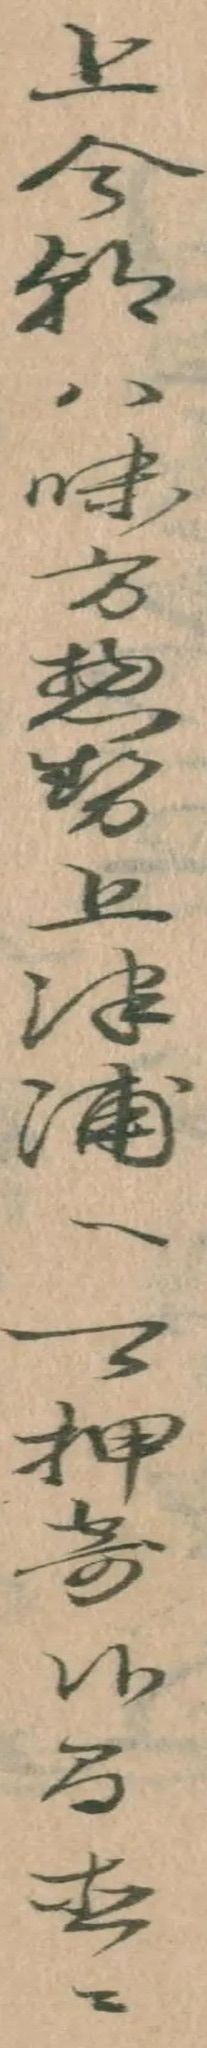上今朝は味方惣勢上津浦へ可押寄候間直に
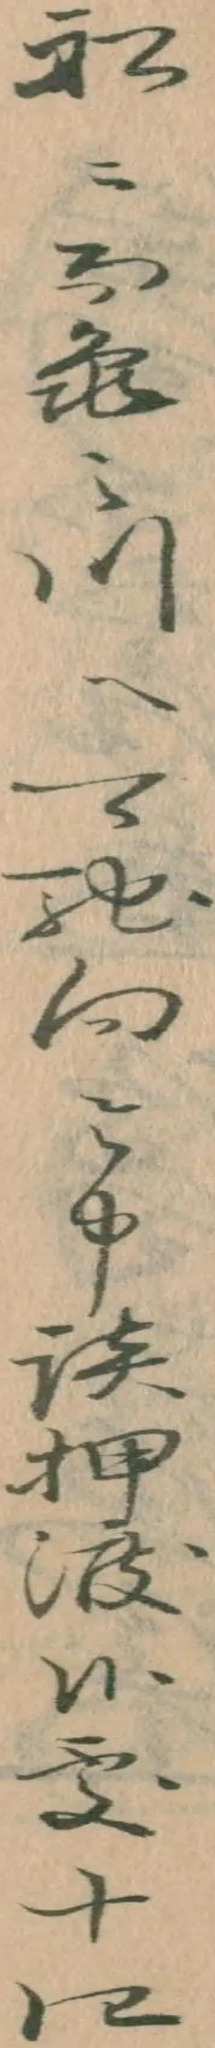舩に而亀之川へ可馳向与申談押渡候處十四
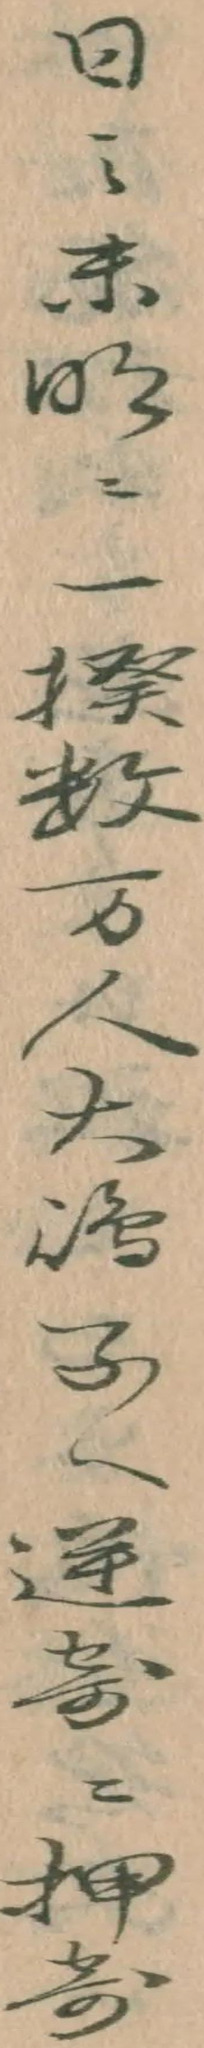日之未明に一揆数万人大島子へ逆寄に押寄
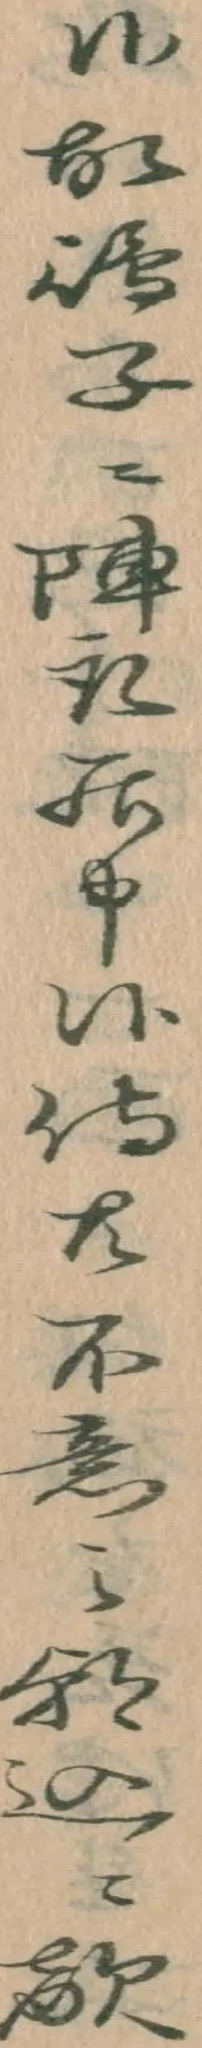候故島子に陣取居申候侍共不意之朝込に敵
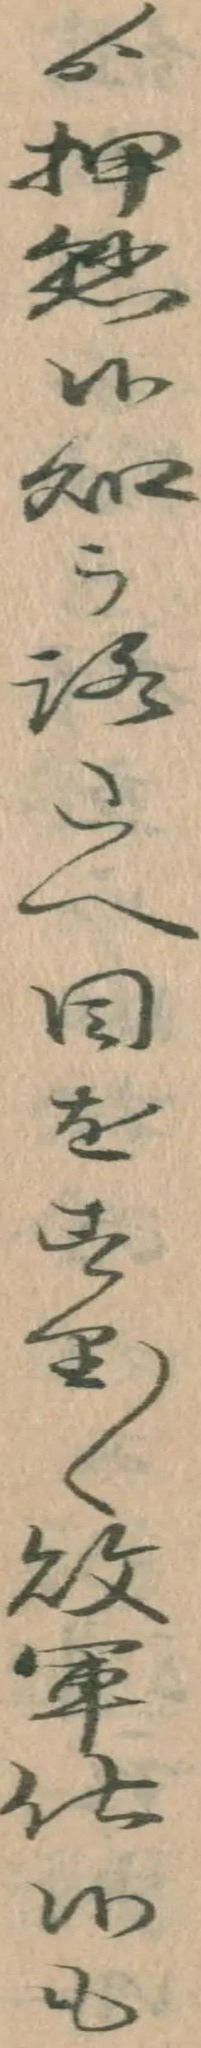ゟ押懸候処う路たへ目を春里〱敗軍仕候も
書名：切支丹御退治記 49巻. [2]
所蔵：国立国会図書館 National Diet Library, JAPAN
